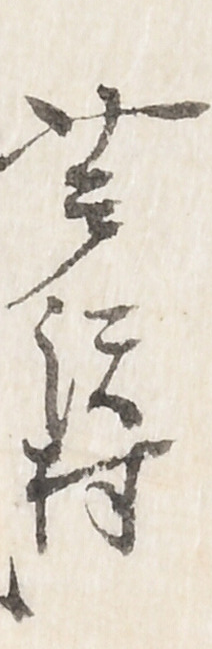芦沢村
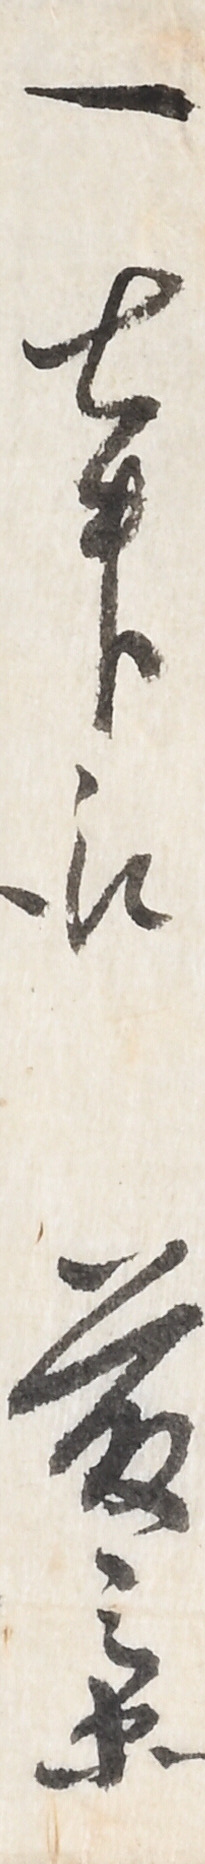一七升取藤兵衛
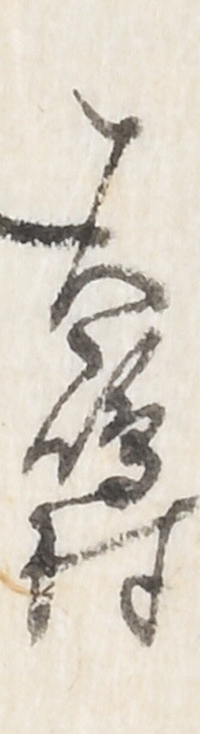大嶋村
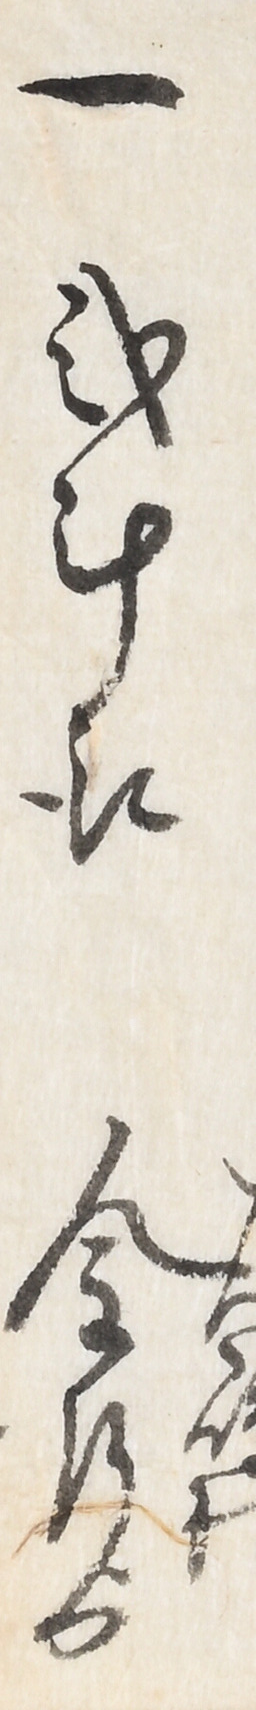一弐斗取金左衛門
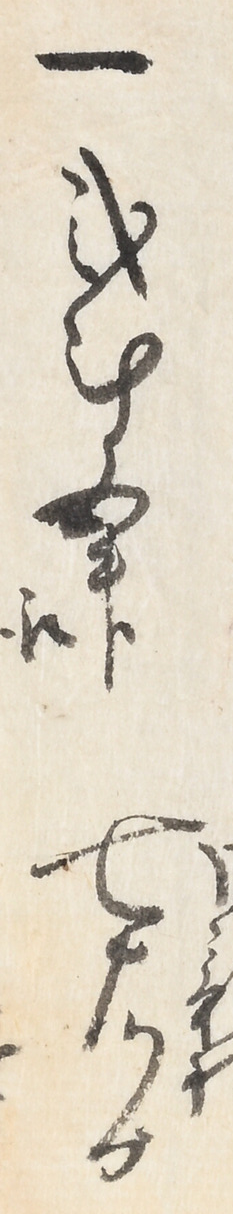一弐斗五升七右衛門
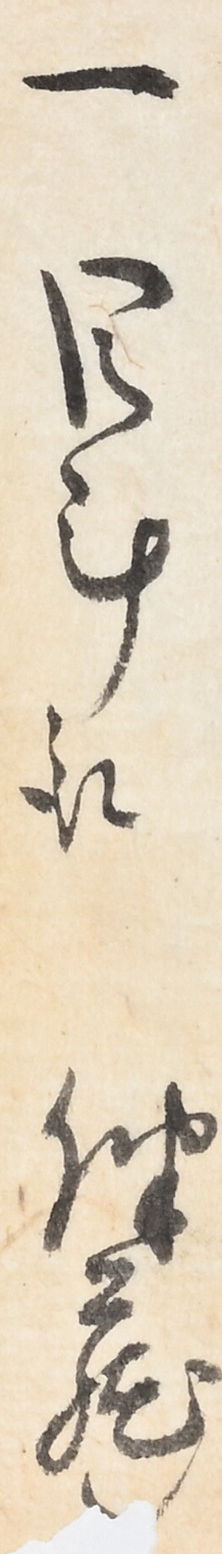一四斗取伴蔵
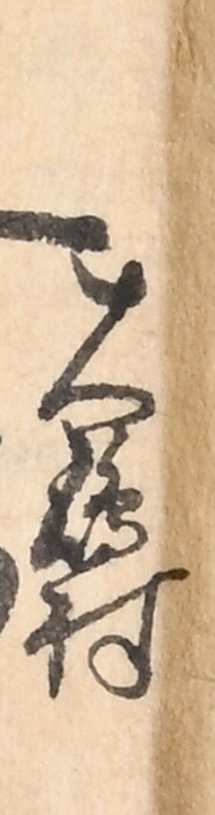大嶋村
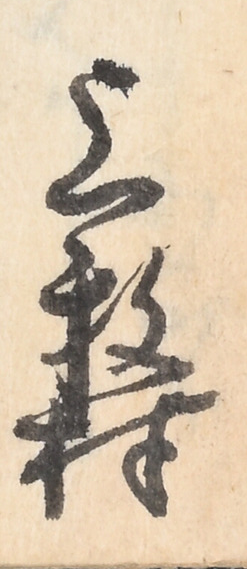上牧村

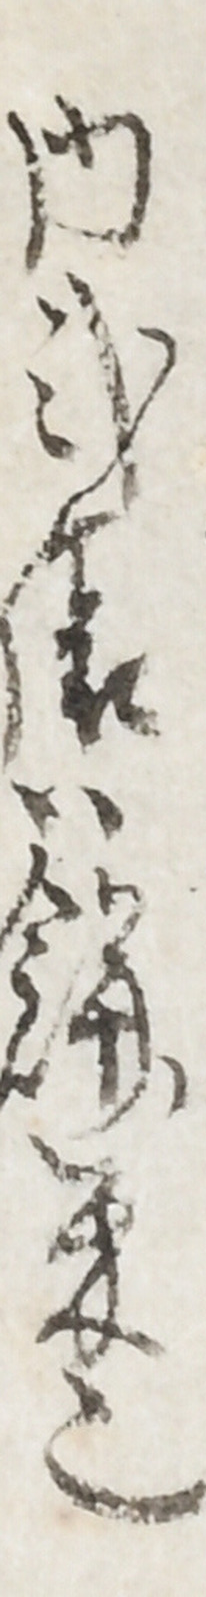内弐俵ハ餅米也
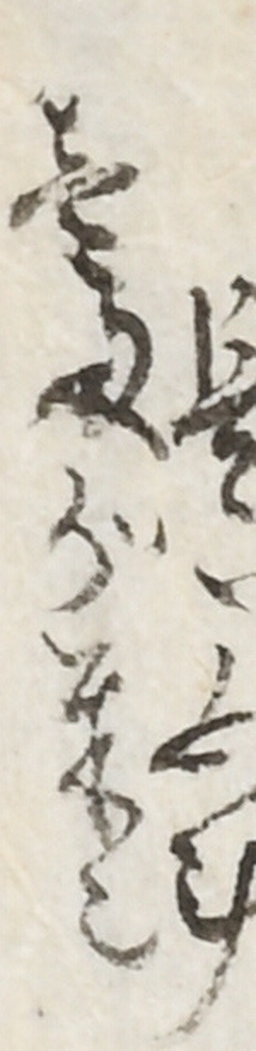壱両が米也
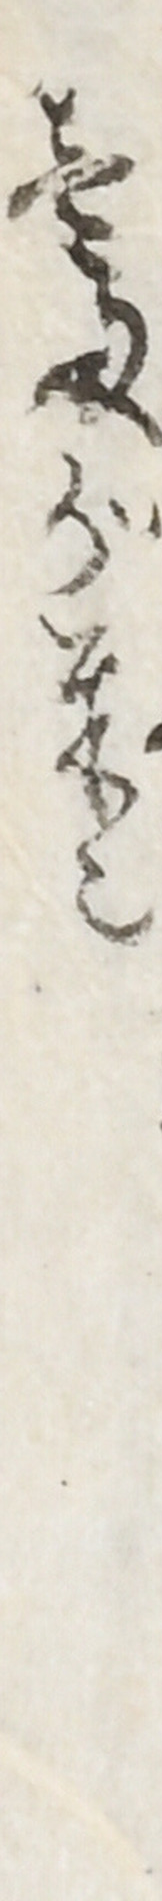壱両が米也
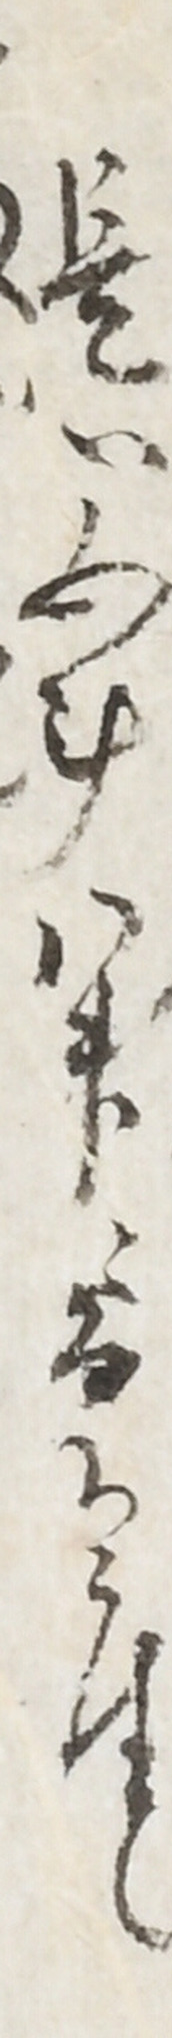是ハ五斗八升ニ而御座候
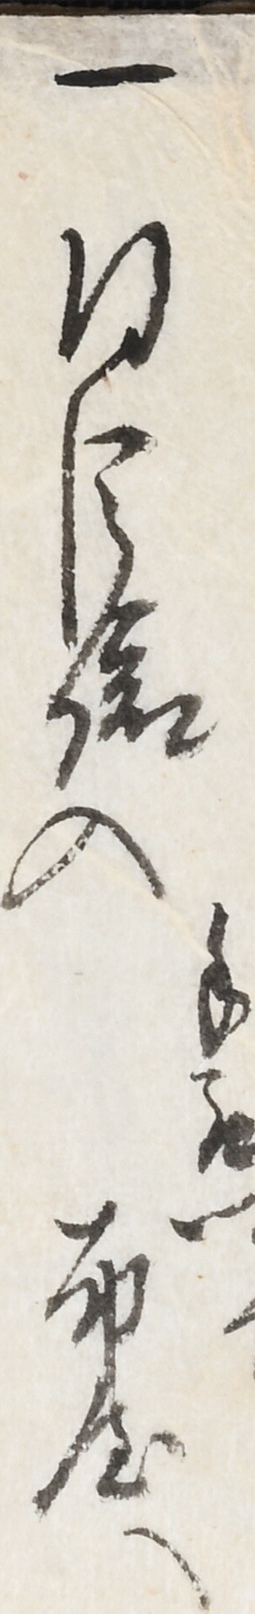一同四俵入卯屋へ

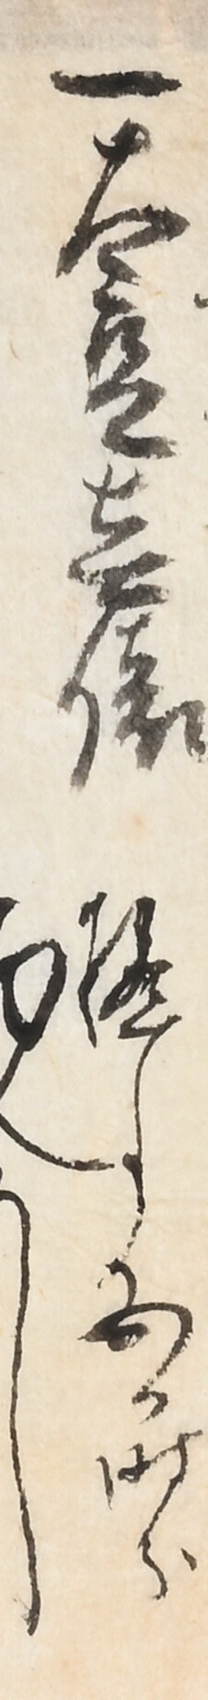一太豆壱俵極月五日時分
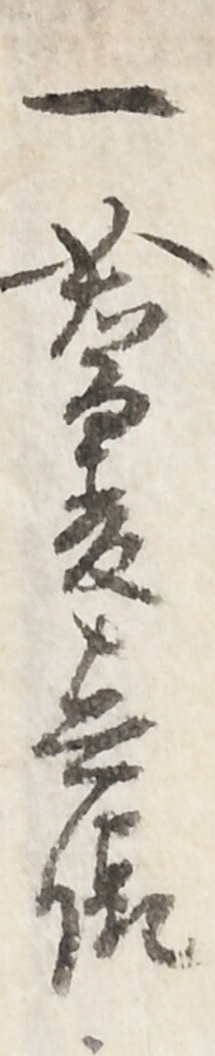一小麦壱俵
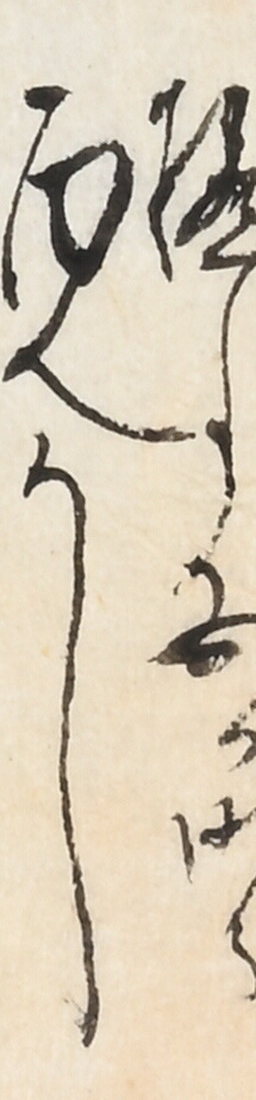百文かし
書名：合力覚帳
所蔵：伊那市立高遠町図書館・合同会社AMANE
